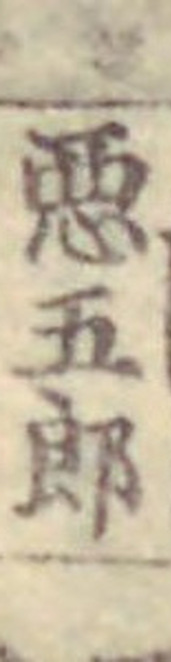悪五郎
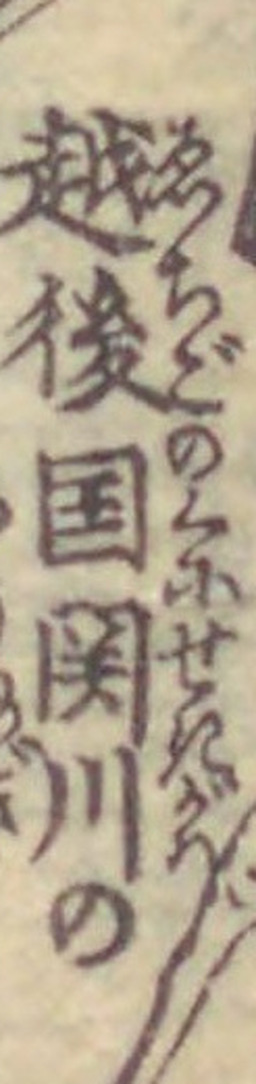越後国関川の
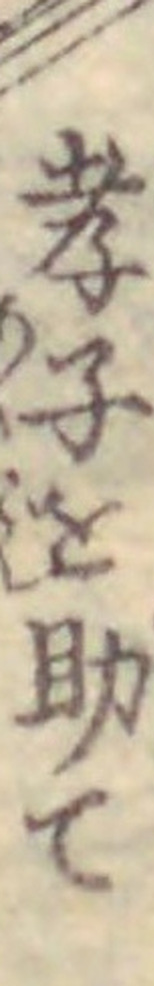孝子を助て
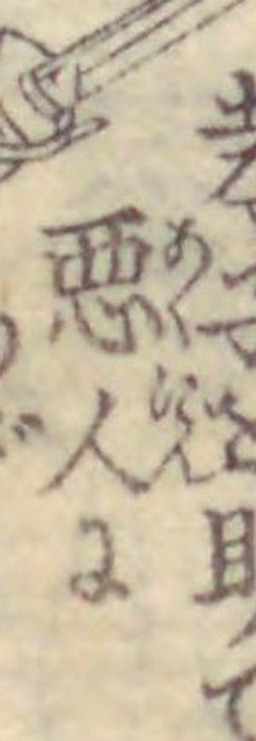悪人に
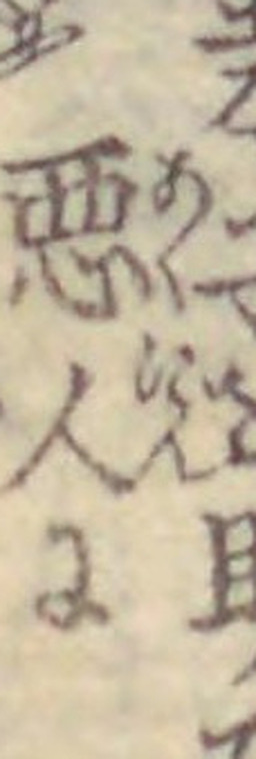悪人に
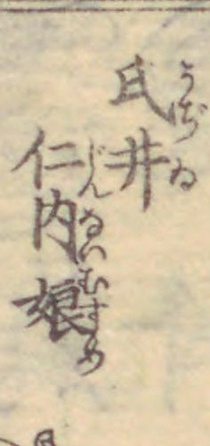仁内娘
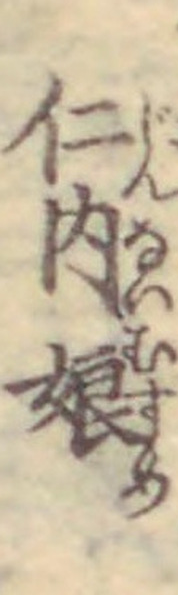仁内娘
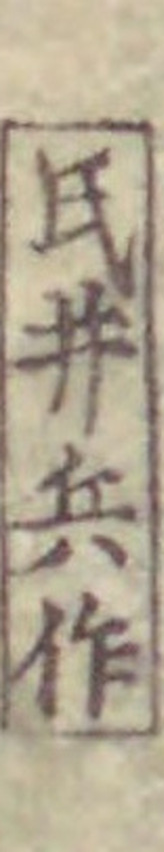氏井兵作
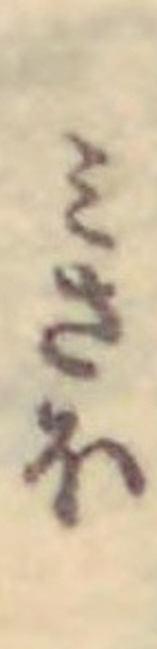みさほ

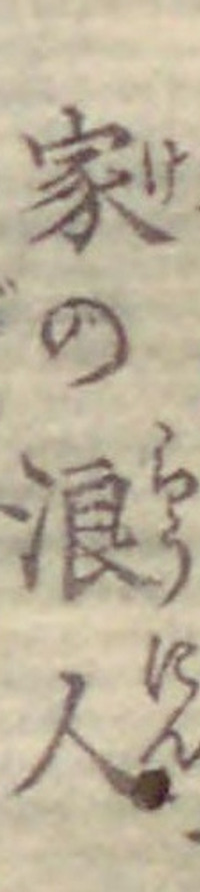家の浪人
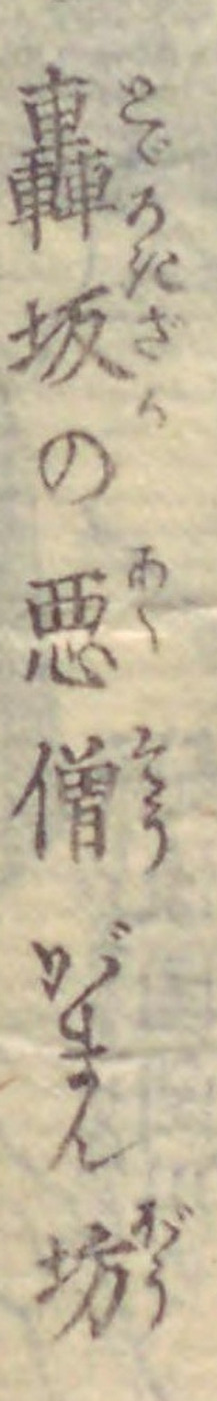○轟坂の悪僧がまん坊
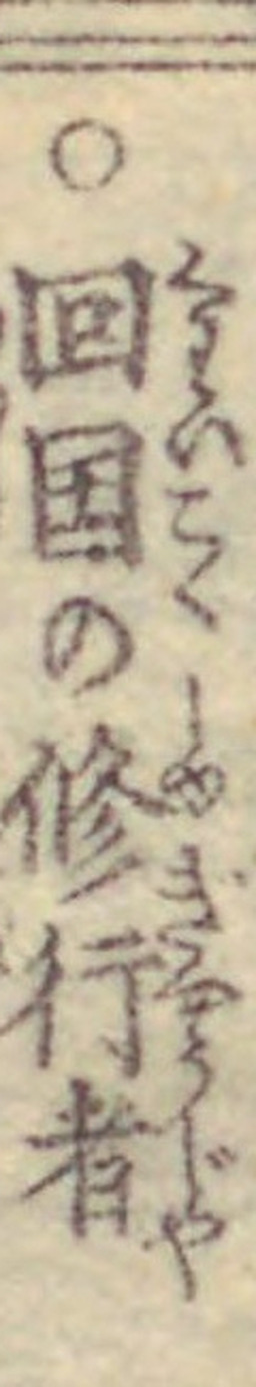○回国の修行者
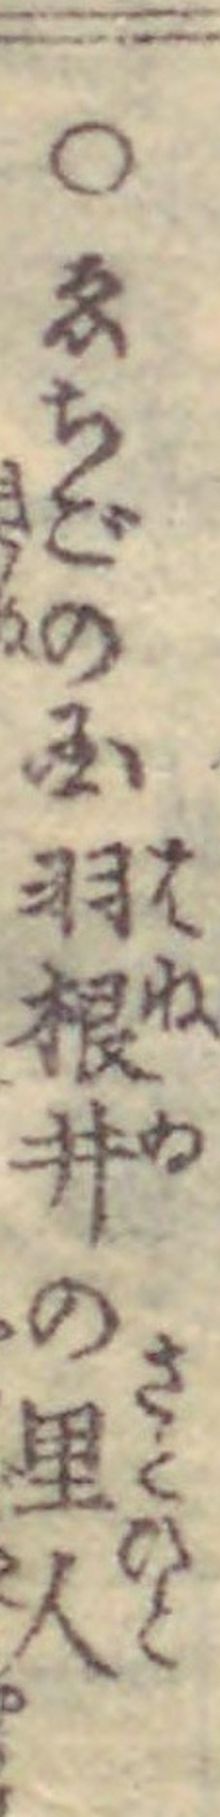○ゑちごの国羽根井の里人
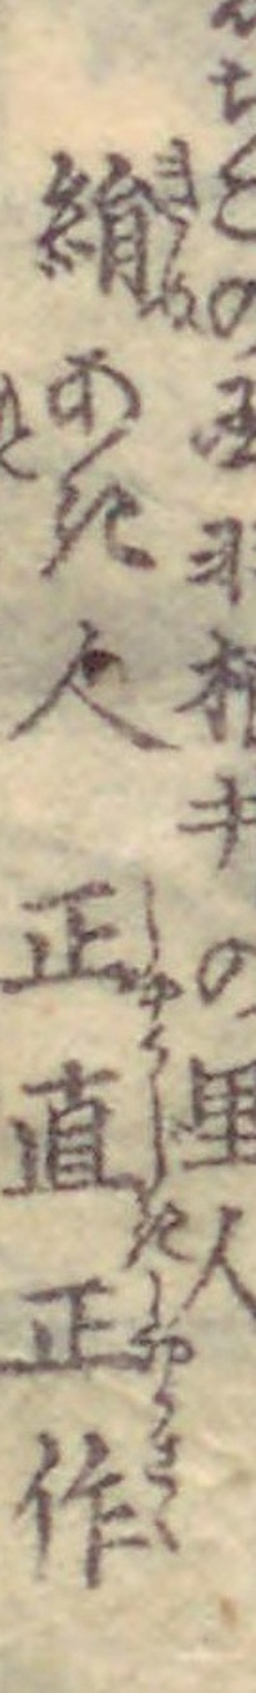絹あき人正直正作
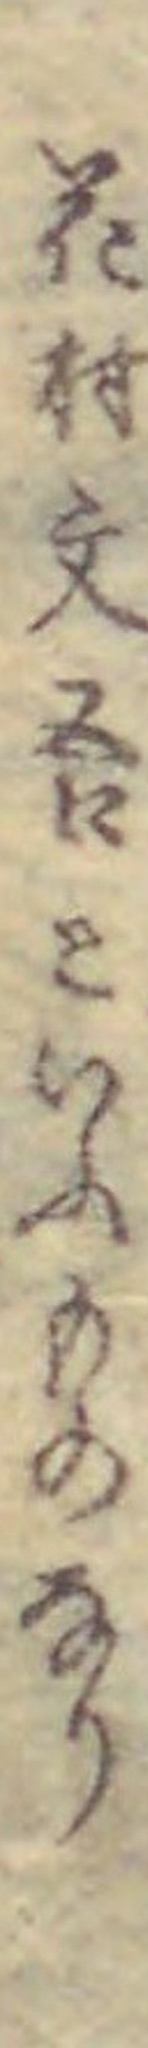花村文吾といふものなり
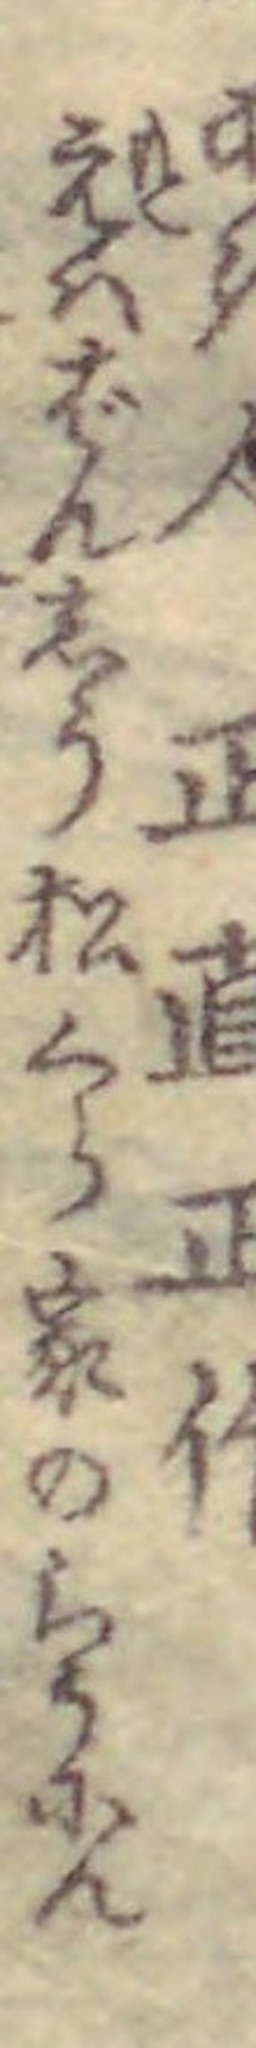元はばんしう松くら家のらうにん
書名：八ツ目鱣因縁物語 3巻
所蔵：国立国会図書館 National Diet Library, JAPAN
